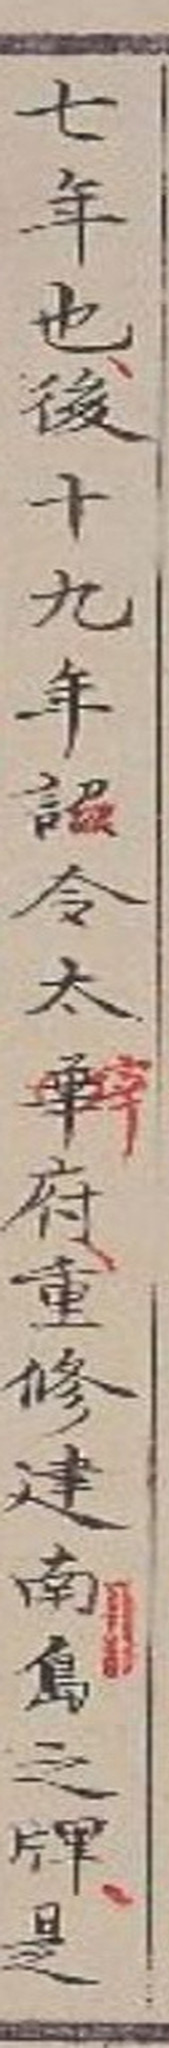七年也、後十九年詔令太華宰府、重修建南島之牌、是
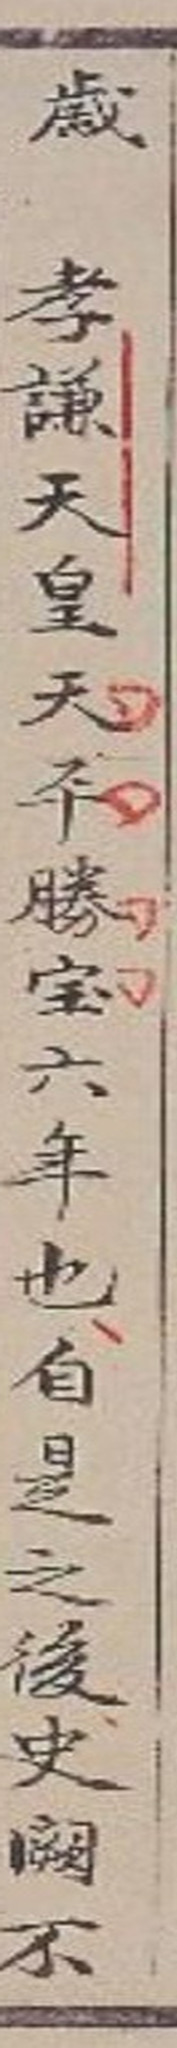歳孝謙天皇天平勝宝六年也、自是之後、史闕不
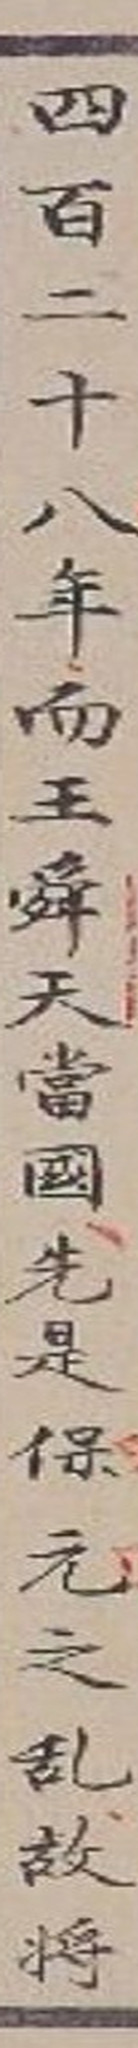四百二十八年、而王舜天当国、先是保元之乱、故将
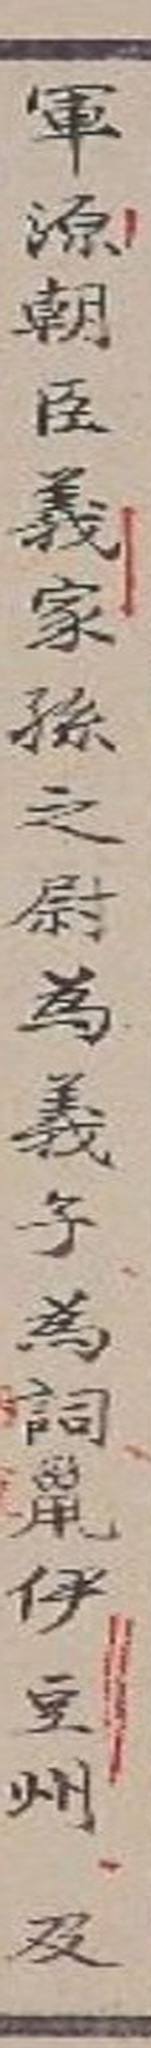軍源朝臣義家孫之尉為義子、為詞朝、鼠寮伊豆州、及
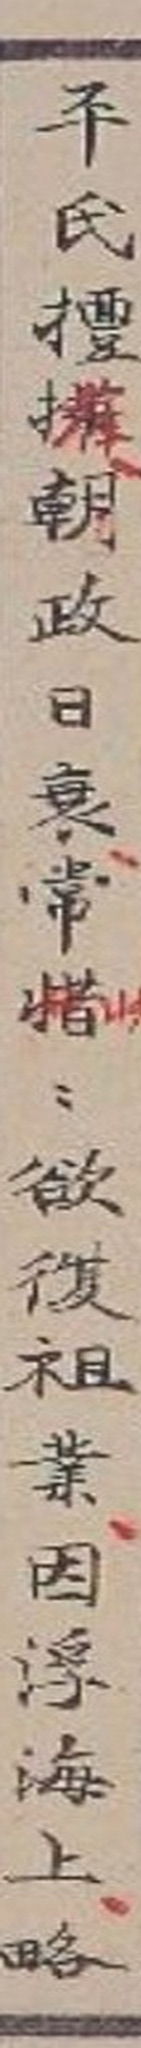平氏檀権、朝政日衰、常措々欲復祖業、因浮海上、略
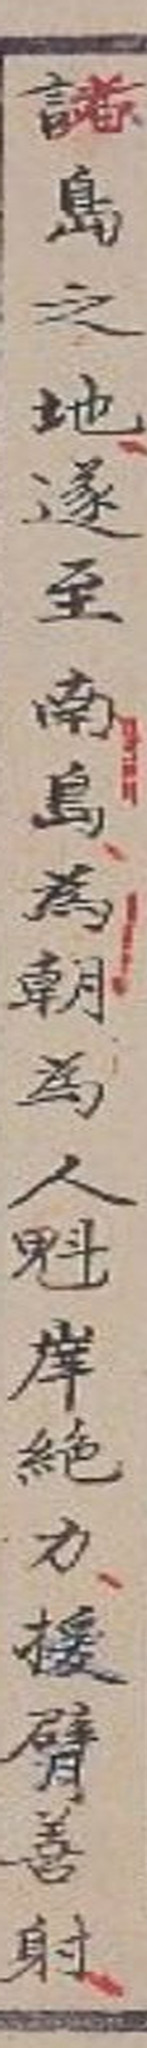諸島之地、遂至南島、為朝為人魁岸絶力、援臂善射、

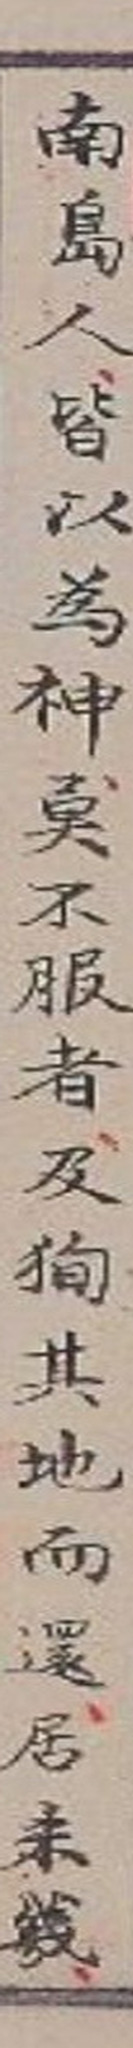南島人、皆以為神莫不服者、乃狥其地而還、居未幾、
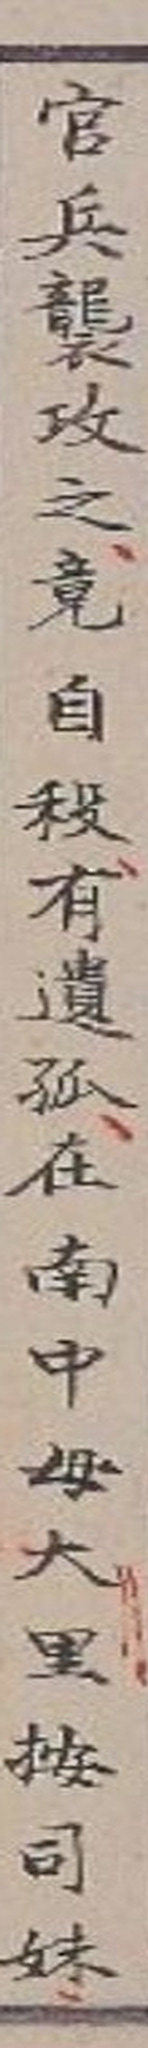官兵襲攻之、竟自殺、有遺孤、在南中母大里按司妹、
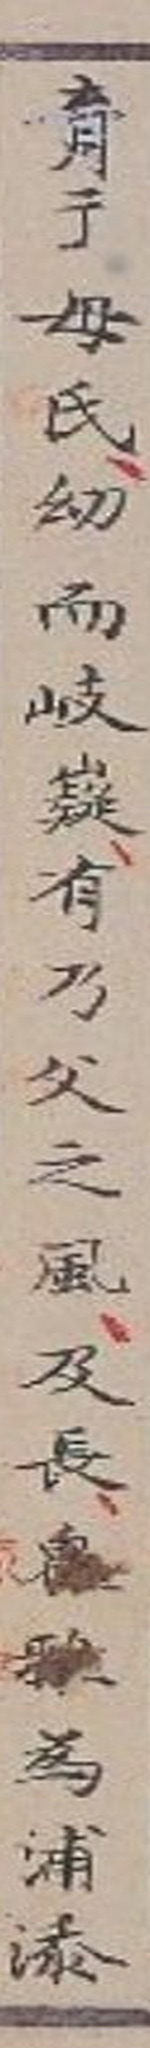育于母氏、幼而岐嶷、有乃父之風、及長、衆雅推為浦添
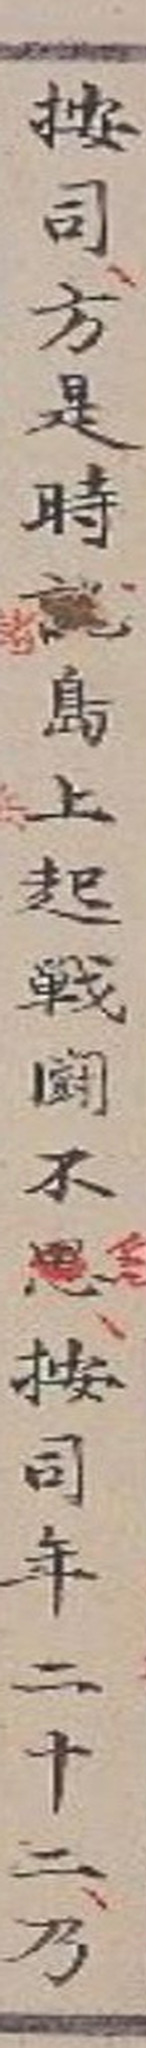按司、方是時説諸島上兵起戦闘不思息、按司年二十二、乃
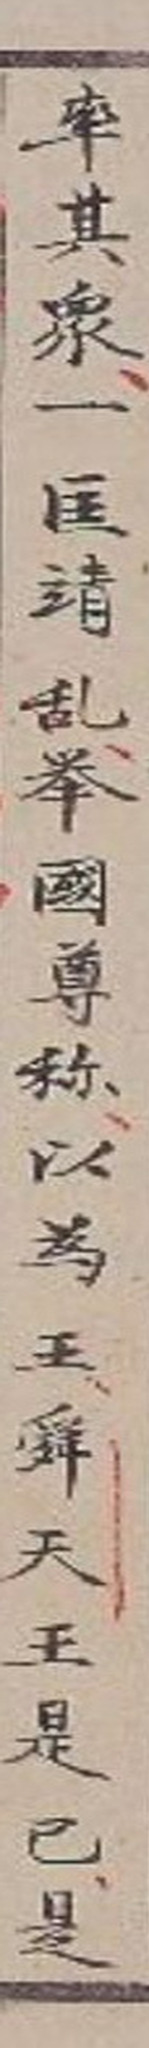率其衆、一匡靖乱、挙国尊称、以為王、舜天王是已、是
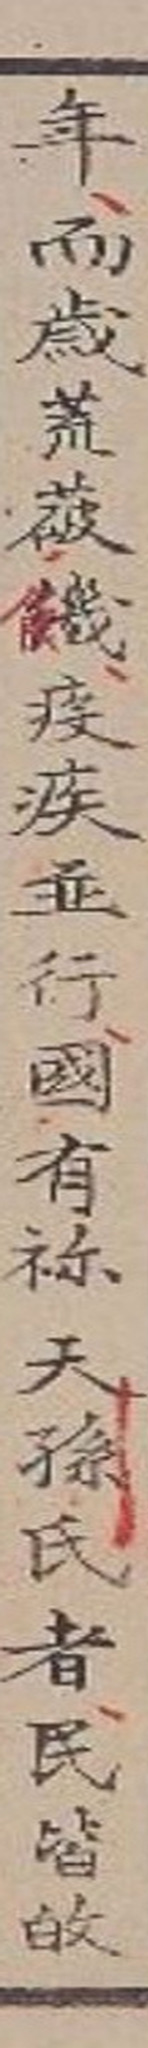年、而歳荒饑、疫疾並行、国有禰天孫氏者、民皆敀

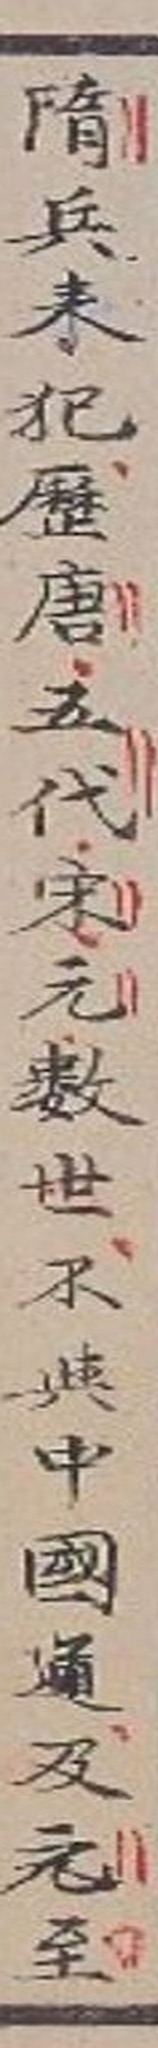隋兵来犯、歴唐・五代・宋・元数世、不輿中国通、及元至
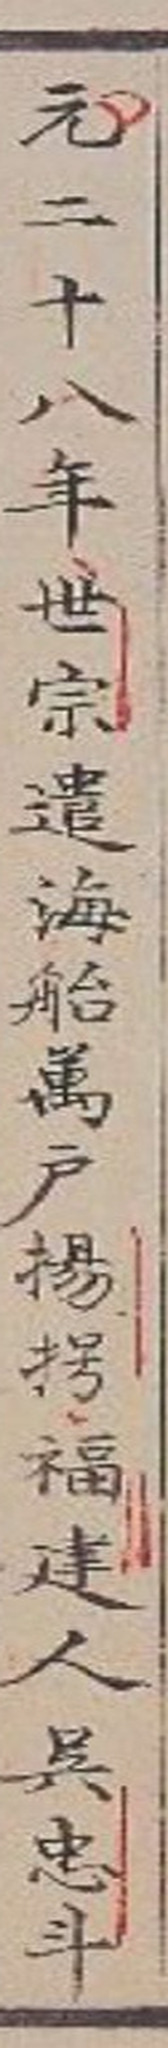元二十八年、世宗遣海船万戸揚、福建人吳忠斗
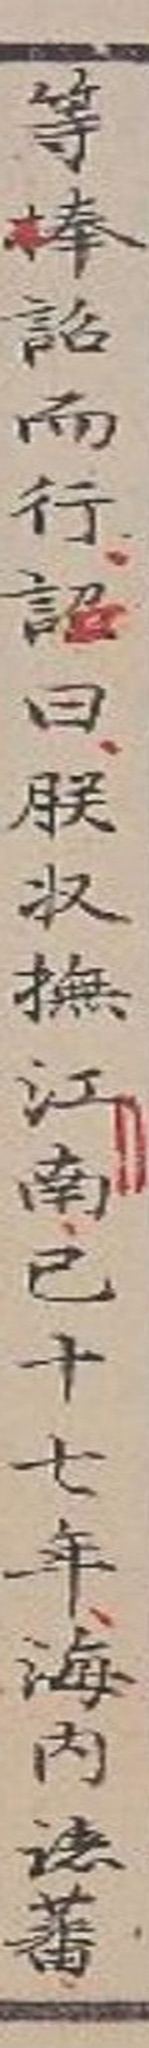等捧詔而行、詔曰、朕収撫江南、巳已十七年、海内諸蕃、
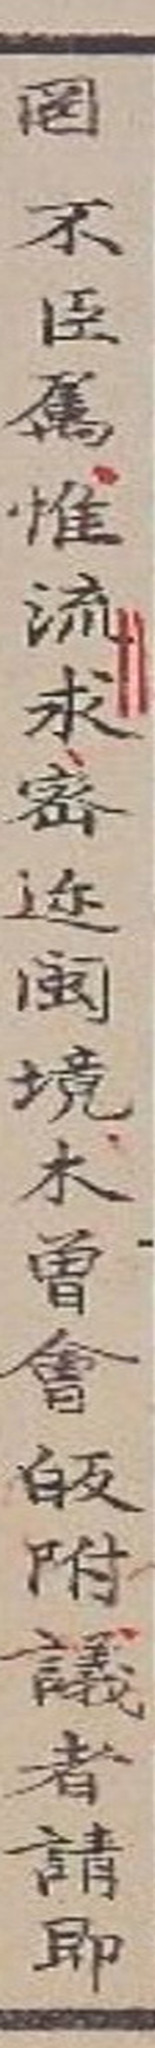罔不臣属、惟流求密邇閩境、木曽会帰附議者請即
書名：南島志 全
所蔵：University of the Ryukyus Library
